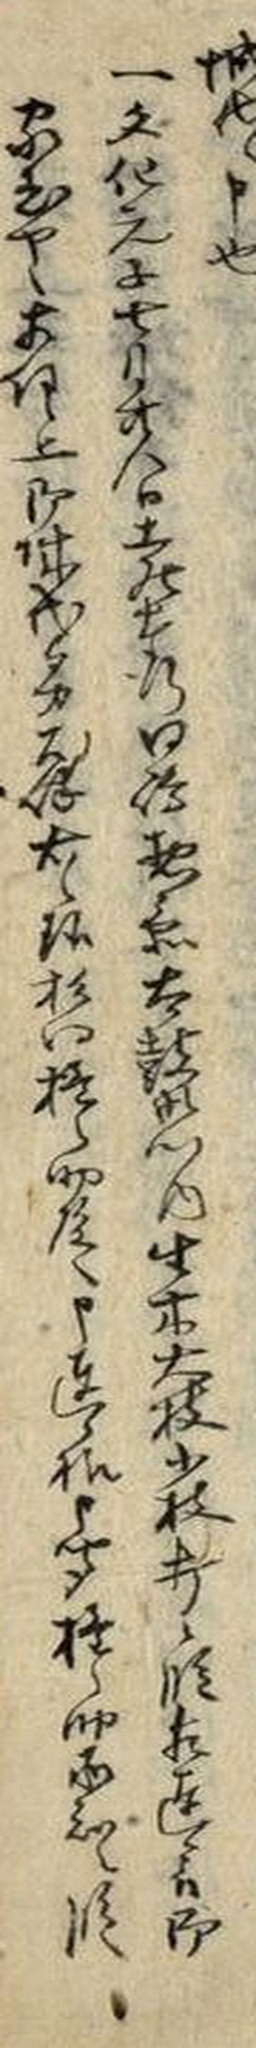家老中へ相伺候上御城代与力召呼右之趣杉田権之助殿へ申達候様申聞権之助承知之段

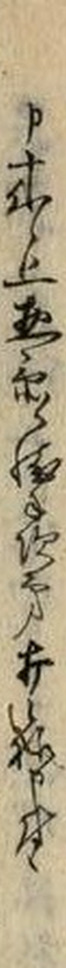申来候上惣兵衛へ勝手次第打候様申付候
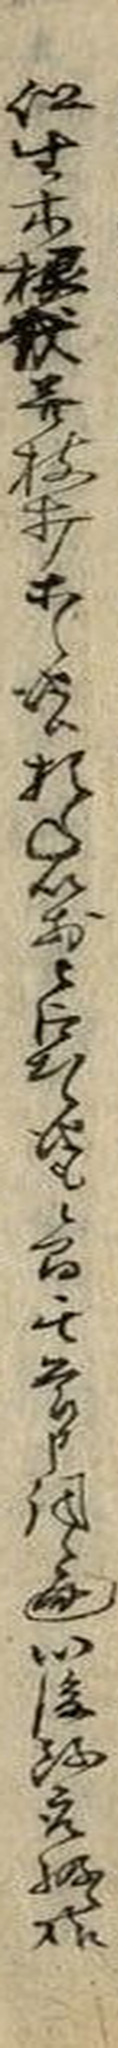但生木根伐并枝打等之儀は拾年以前被仰出候儀も候間其節申伺候通以後致取扱候様
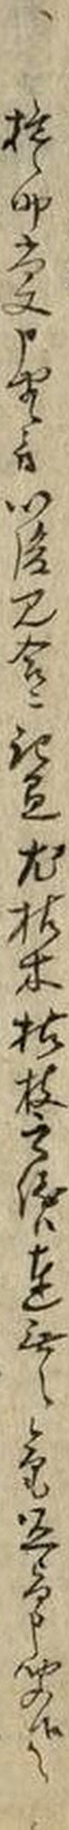権之助尚又申聞候に付以後見合に記置尤枯木枯枝之儀は達無之候ても宜旨申聞候よし
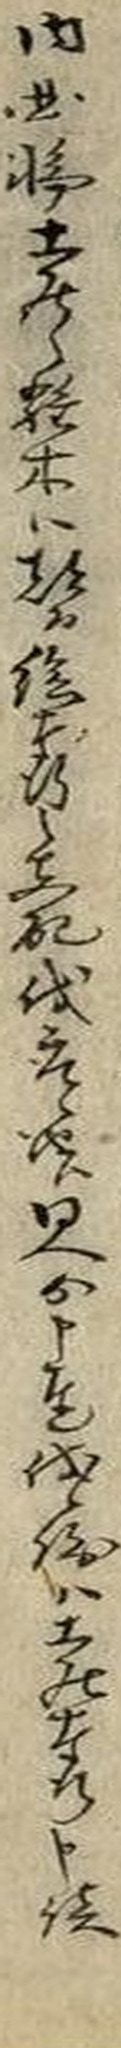一内曲輪土居之雑木は都て絵奉行之支配伐取候儀は同人ゟ申達伐候儀は土居奉行申談
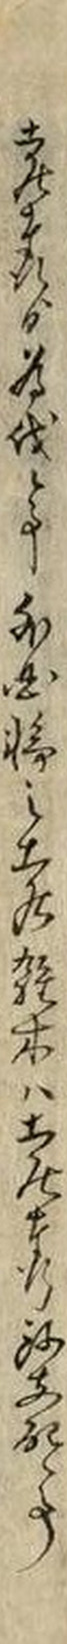土居奉行ゟ為伐候事外曲輪之土居雑木は土居奉行致支配候事
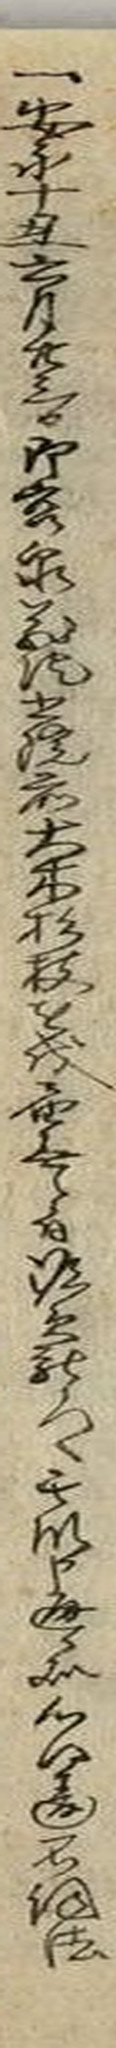一安永十丑六月廿三日御宮泉蔵院書院前大木杉枝を伐届無之に付渥美新右衛門へ其段申通候処心得違不調法
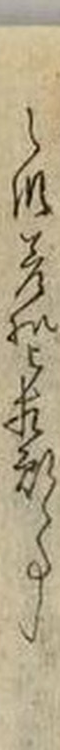之段差控被相願候事
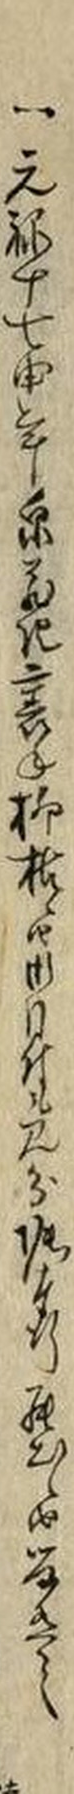一元禄十七申年泉蔵院裏手柳枯候由御目付も見分堀奉行罷出候由留有之
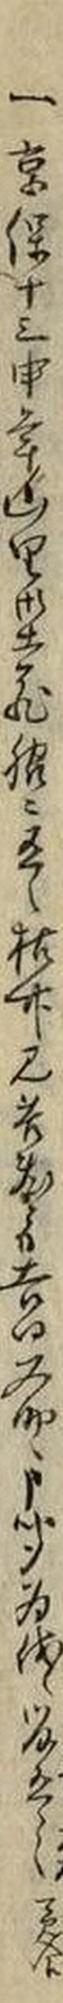一享保十三申年山里御土蔵脇に有之枯竹見苦敷に付吉田又助へ申聞為伐候留有之諸方支配之部可見合
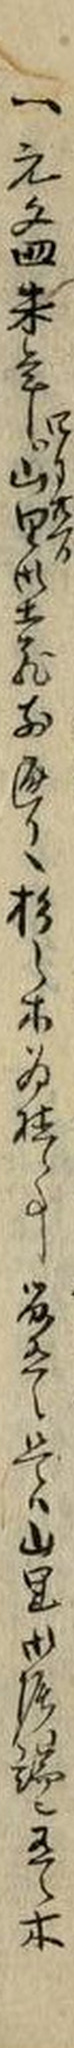一元文四未年◦四月廿一日山里御土蔵前通りへ杉之木為植候事留有之是は山里御堀端に有之木
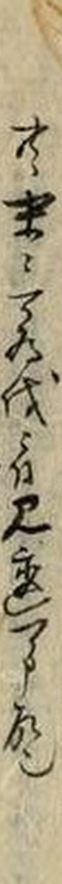共末々可為伐に付見透可申故也
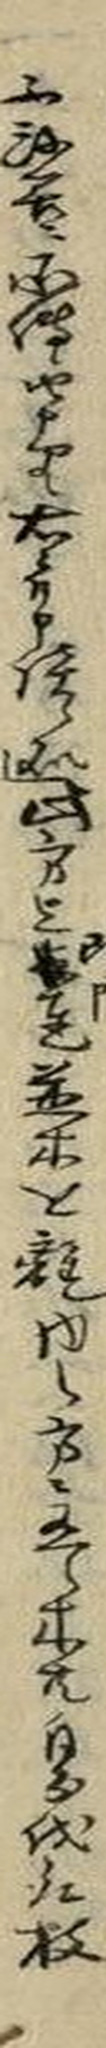不致筈に承伝候由申聞候右に付申談候処」此方迄断申達並木を離レ内之方に有之木共自分伐取枝
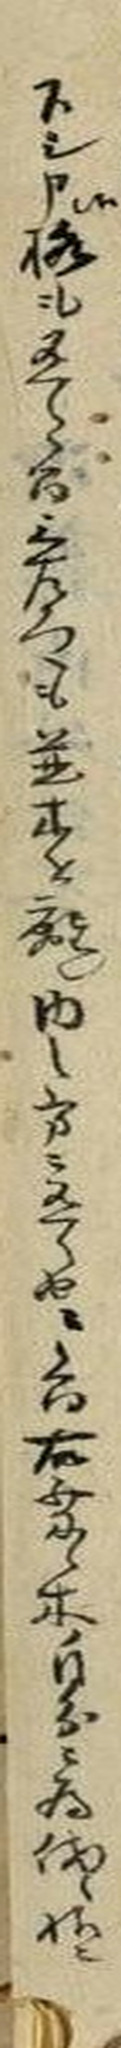下シ申候格も有之候間三左衛門へも並木を離レ内之方に有之由に候間右栗之木自分に為伐候様に
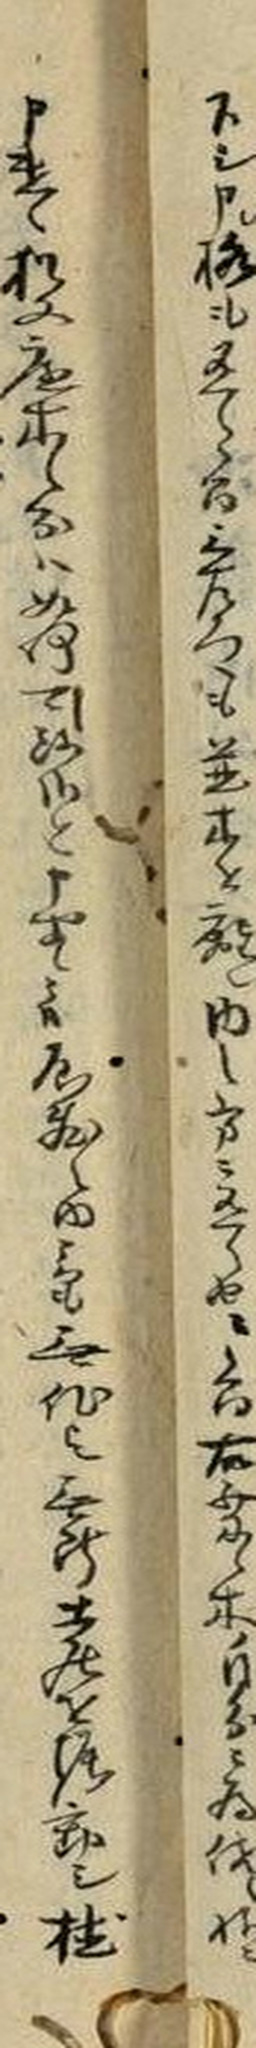申遣候猶又庭木之分は如何可致哉と申聞候に付屋敷之内にても無作と無断土居を掘動シ植
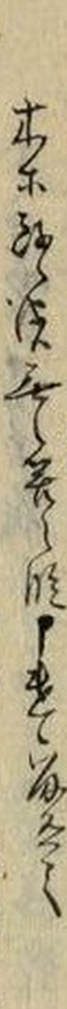木等致候儀は無之筈之段申遣候留有之
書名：御城下諸事之部
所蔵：福井県文書館 Fukui Prefectural Archives
